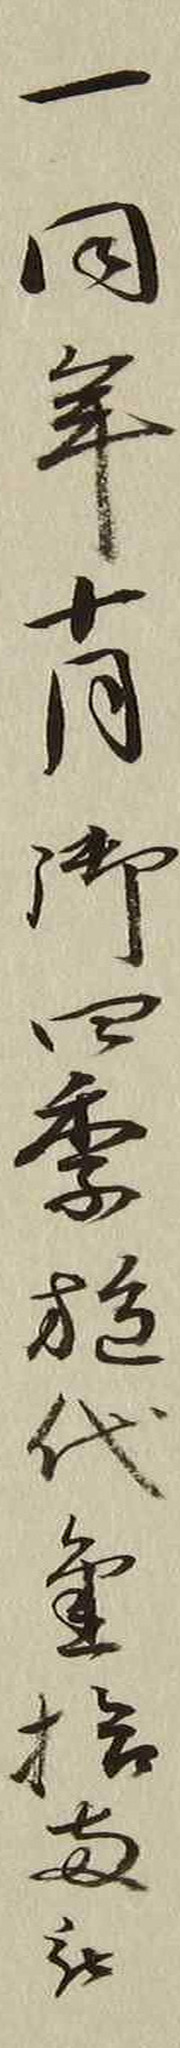一同年十月御四季施代金拾両被
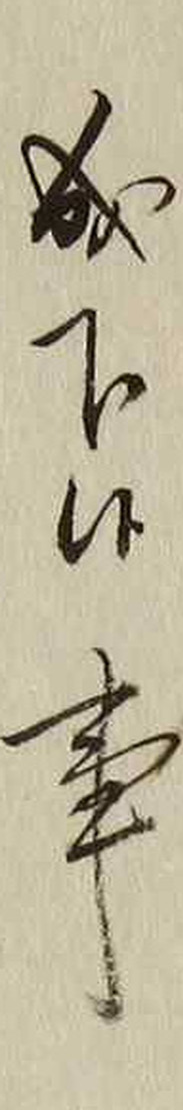成下候事
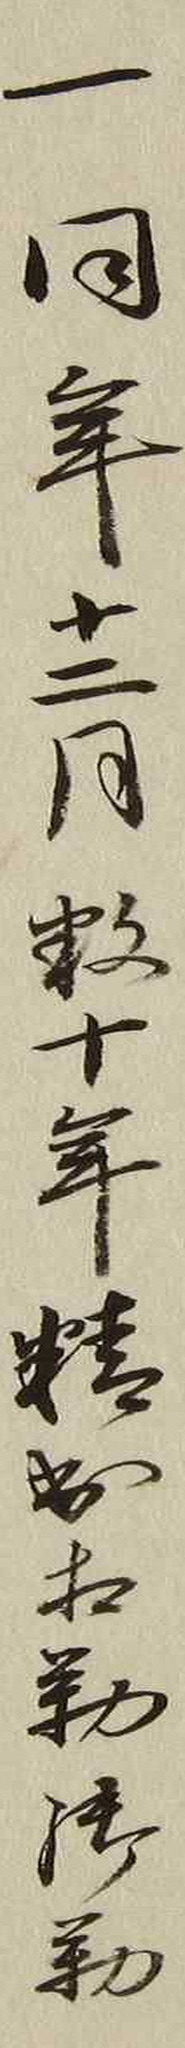一同年十二月数十年精出相勤御勤
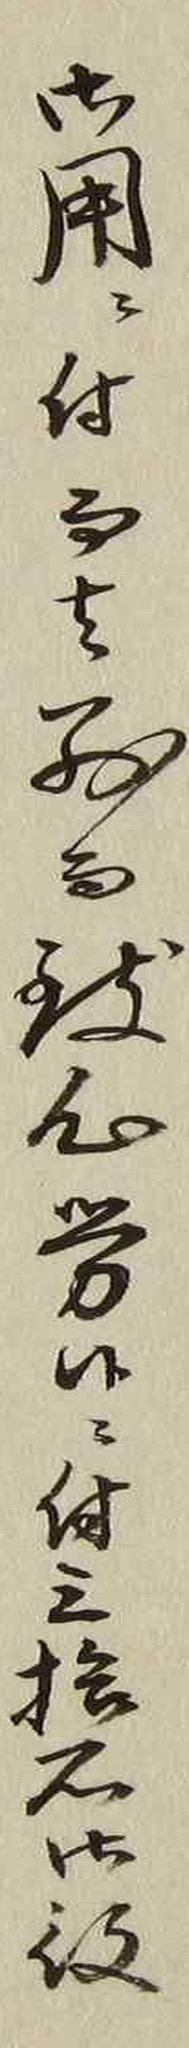御用ニ付而者別而致心労候ニ付三拾石御役
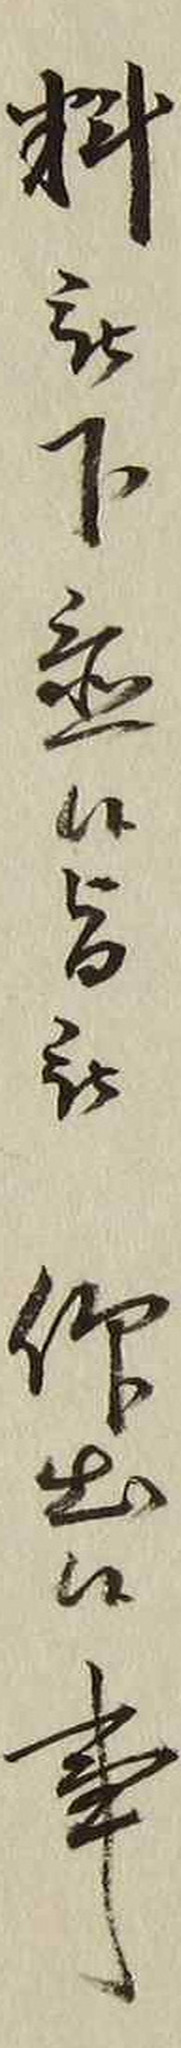料被下置候旨被仰出候事
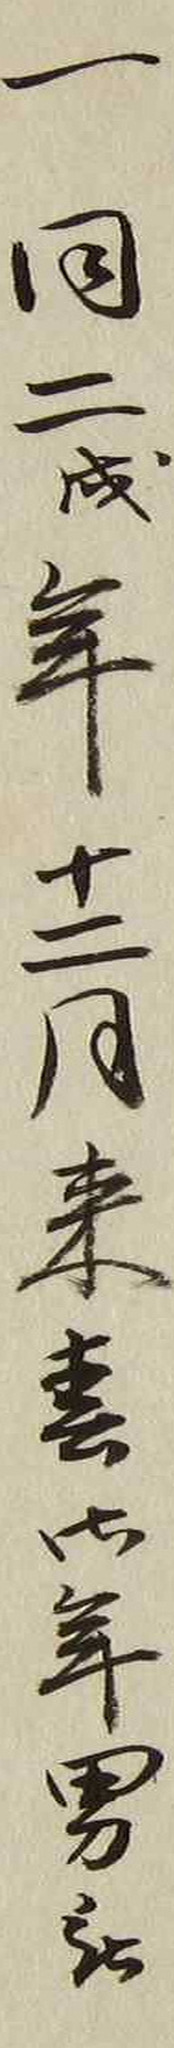一同二戌年十二月来春御年男被
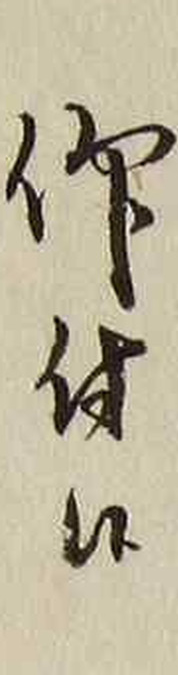仰付候
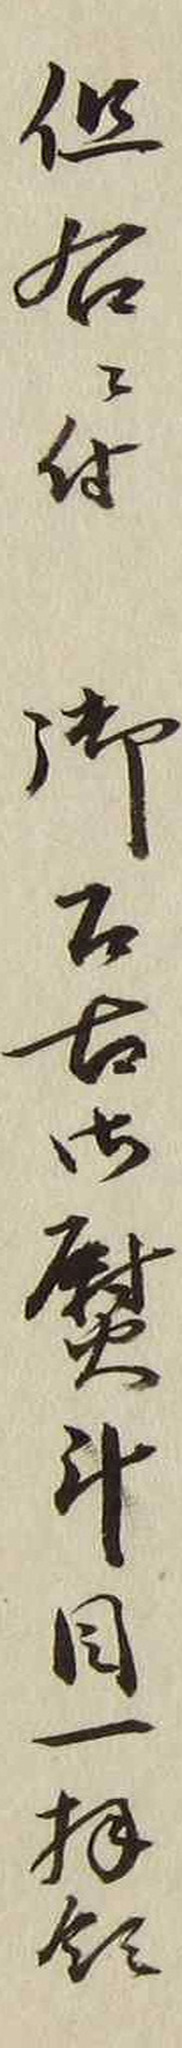但右ニ付御召古御熨斗目一拝領
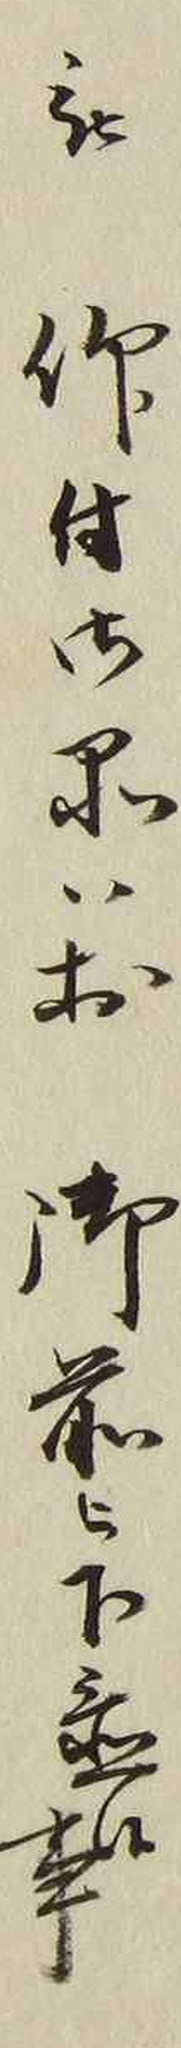被仰付御品ハ於御前被下置候事

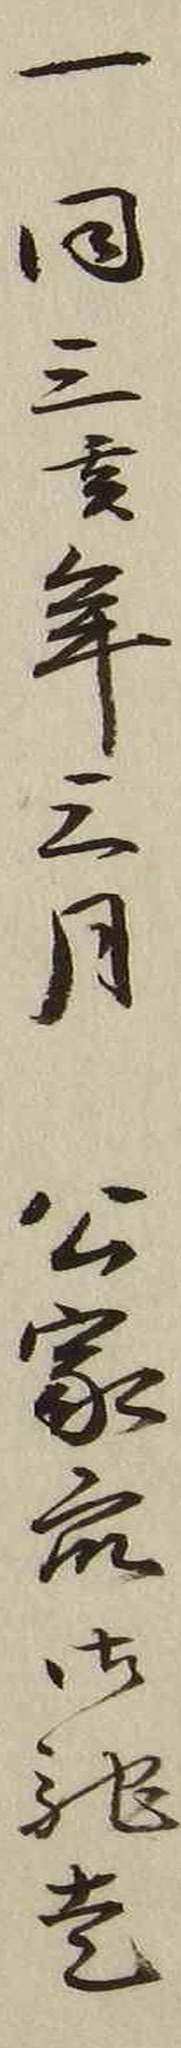一同三亥年三月公家衆御馳走
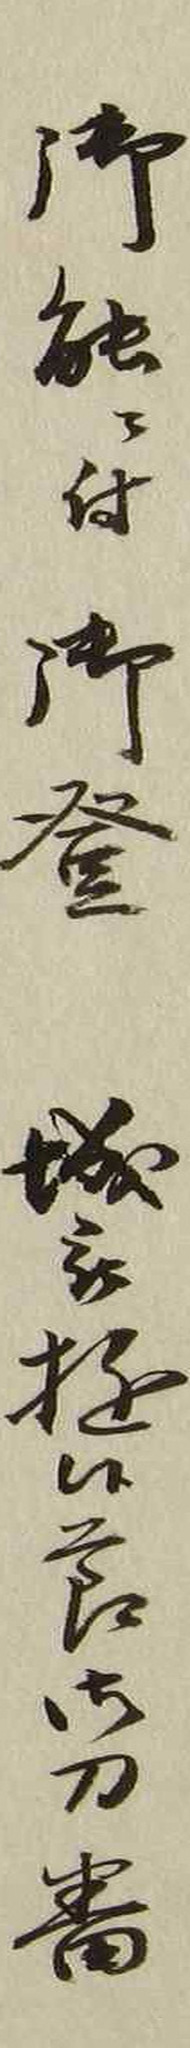御能ニ付御登城被遊候節御刀番
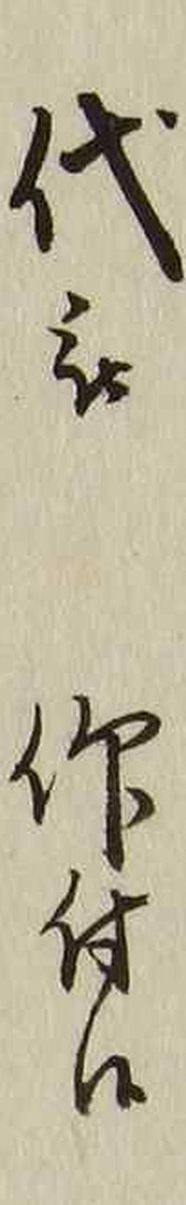代被仰付候
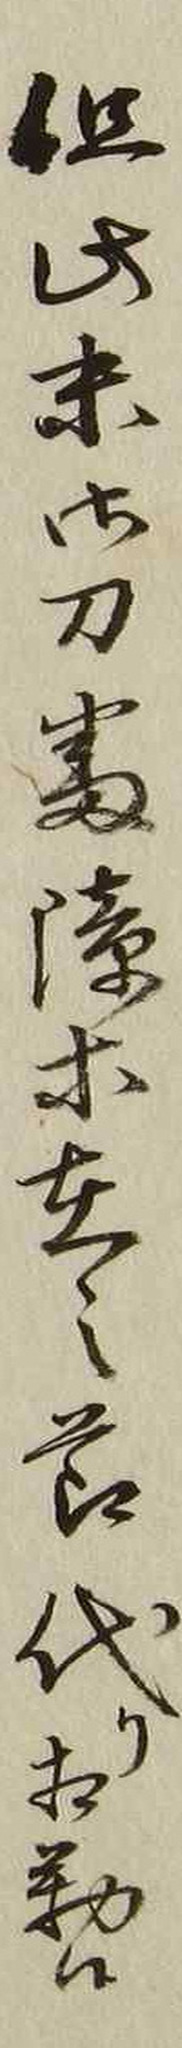但此末御刀番障等在之節代り相勤候
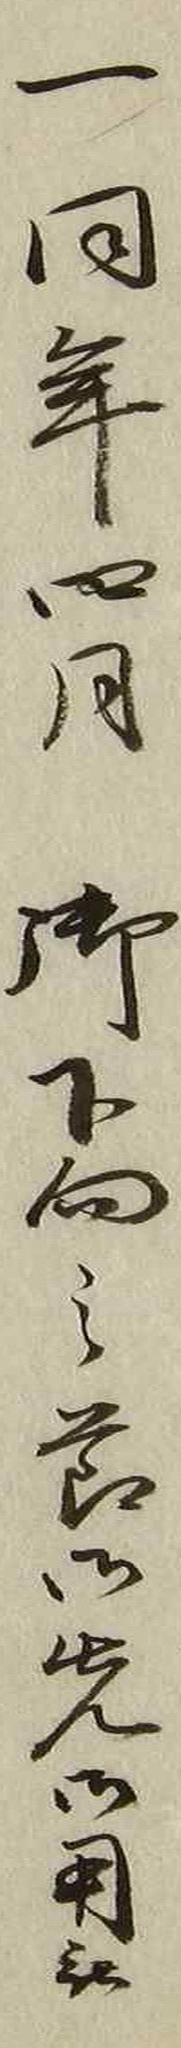一同年四月御下向之節御先御用被
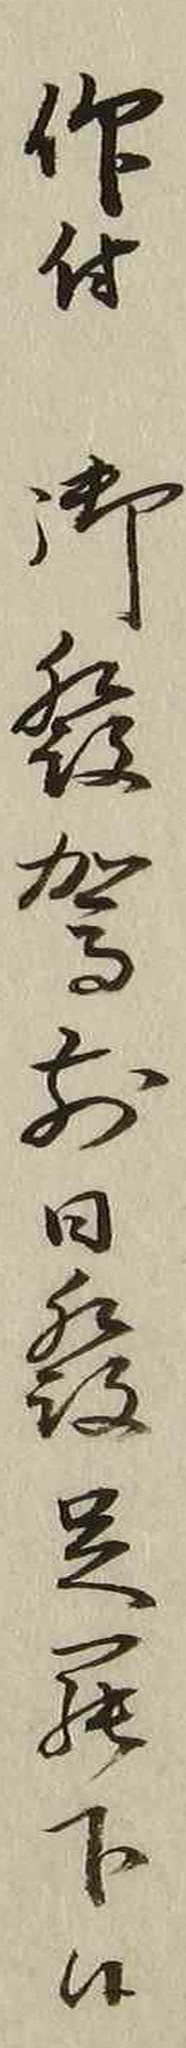仰付御発駕前日発足罷下候
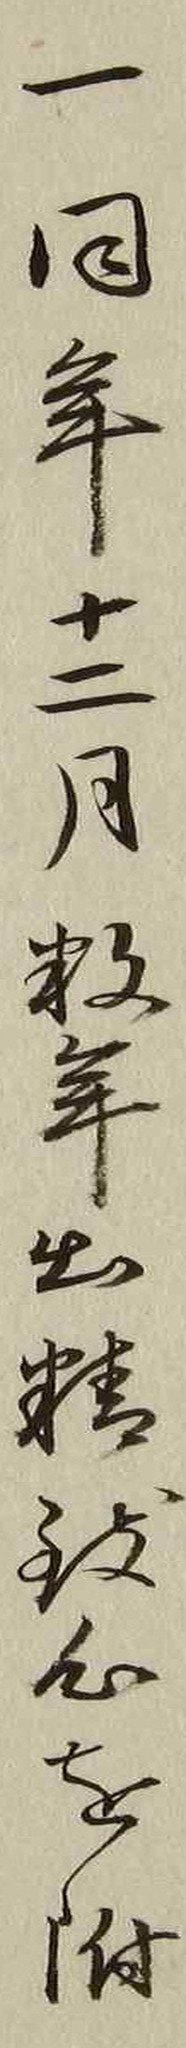一同年十二月数年出精致心を附
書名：諸士系譜　巻之160　な之部2
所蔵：会津若松市立会津図書館
